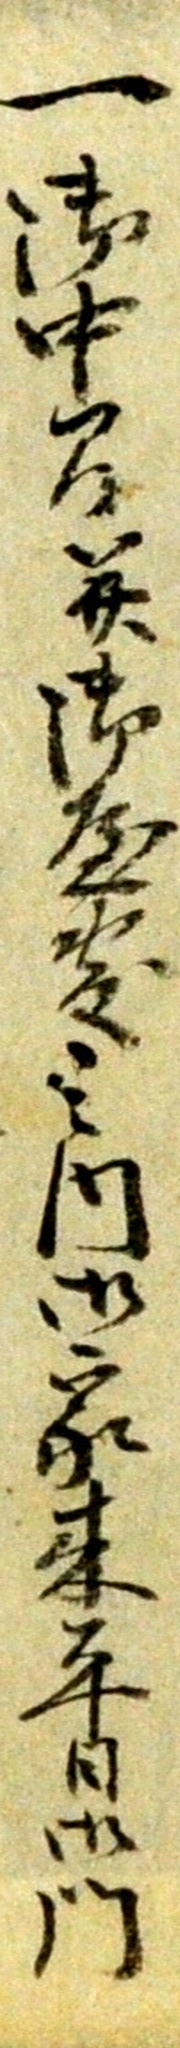一御中間并御屋敷之内御家来平日御門
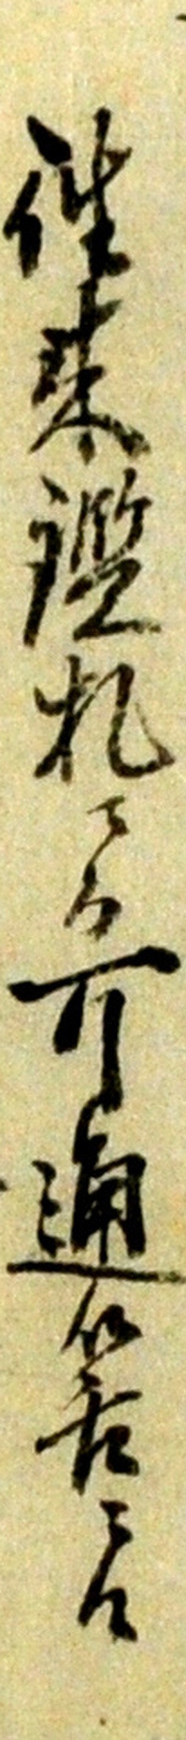往来鑑札ニ而可通筈ニ而
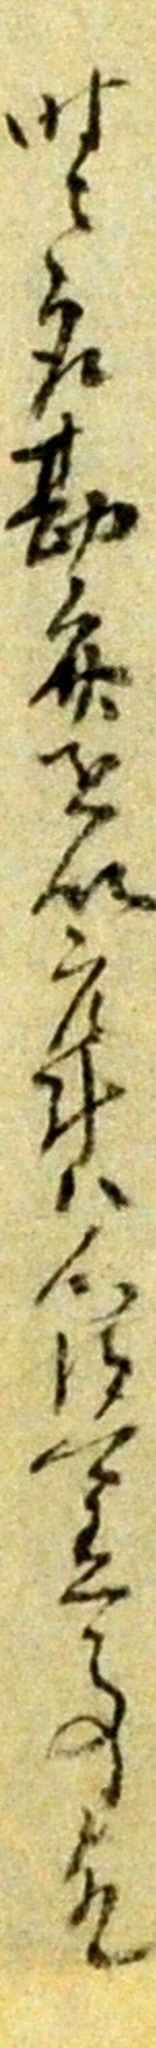時々取勘弁を以元斗ハ心得相可有事歟
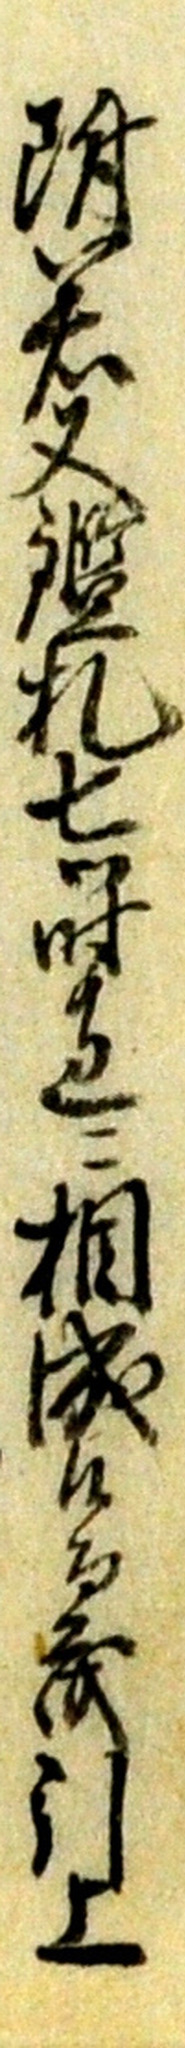附若又鑑札七ツ時過ニ相成候而茂引上
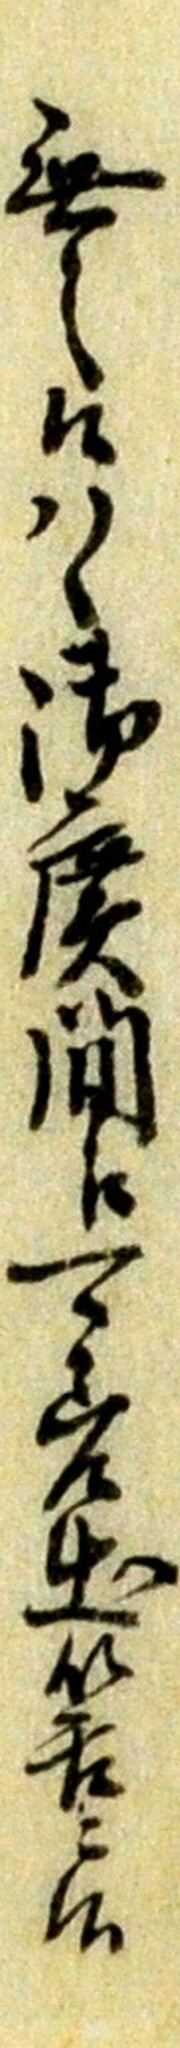無之候ハヽ御広間江可差出筈ニ候
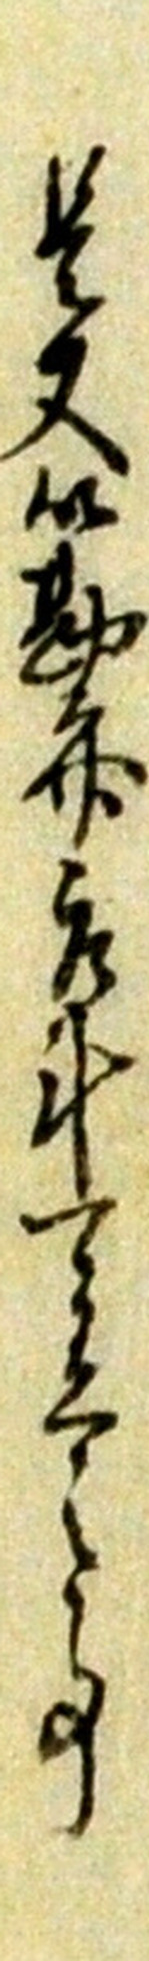是又御勘弁取斗歟有之事
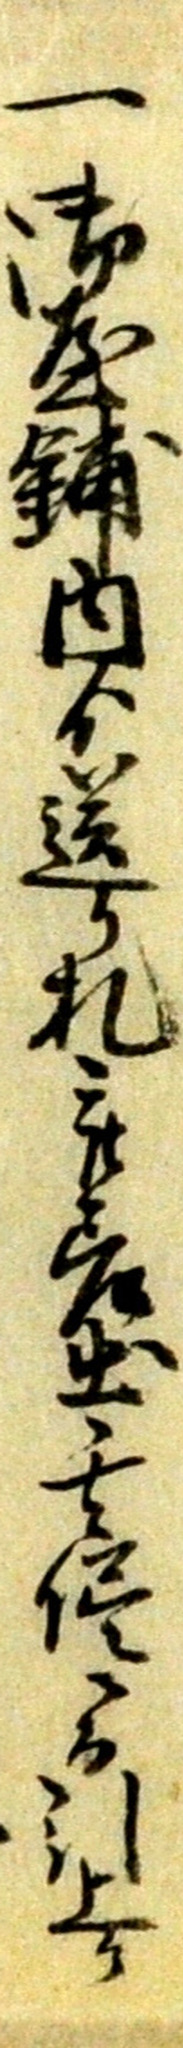一御屋鋪内ゟ送り札被差出其侭ニ而引上ケ
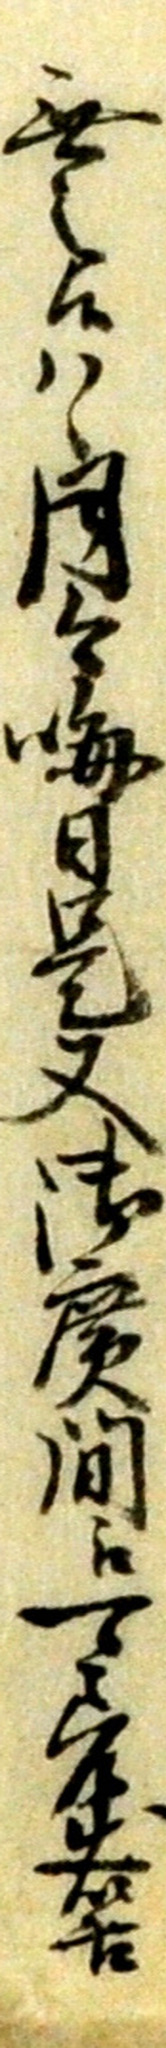無之候ハヽ月々晦日是又御広間江可差出筈
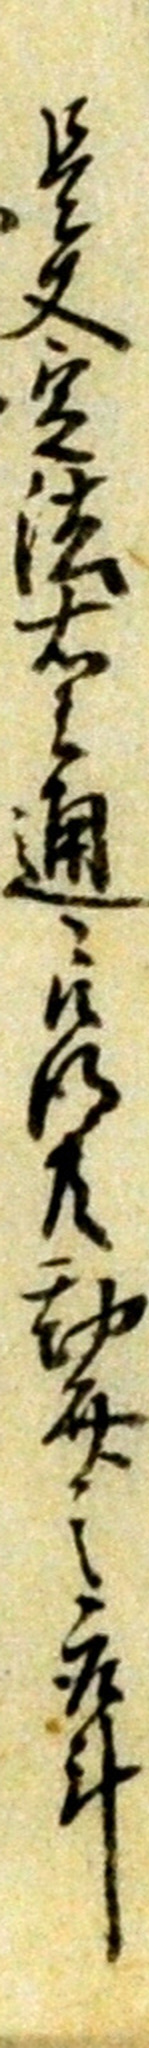是又定法右之通ニ候得共勘弁之取斗
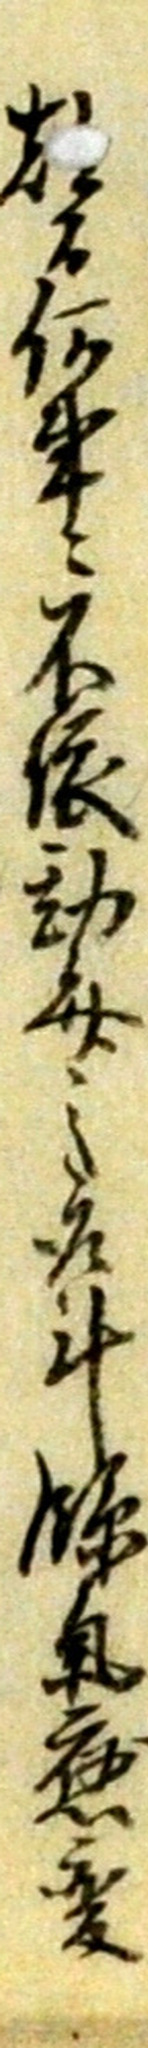斯而何事ニ不依勘弁之取斗臨気応変
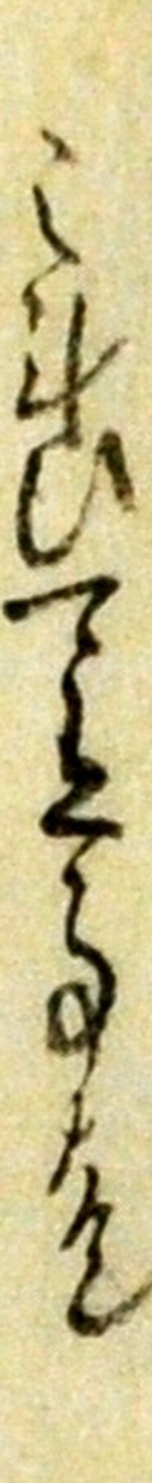之斗ひ可有事歟
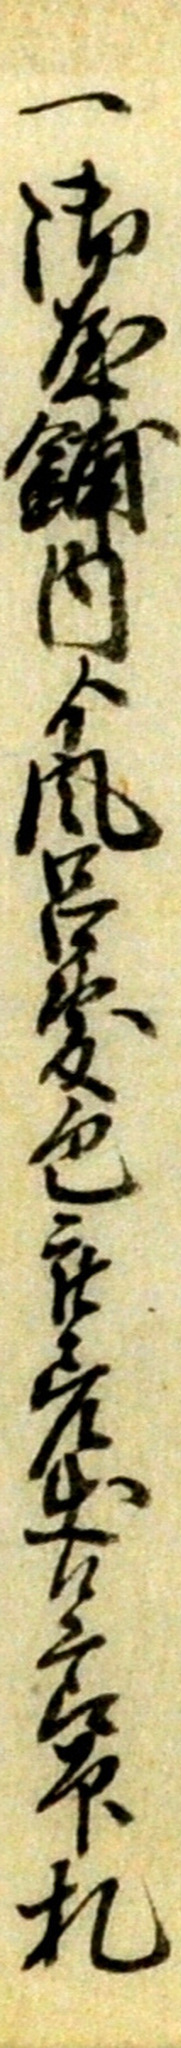一御屋舗内ゟ風呂敷色被差出候節印札
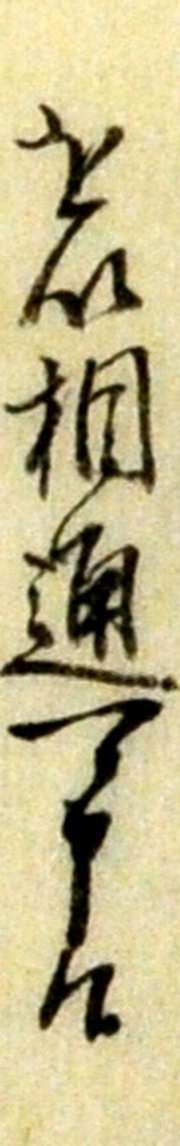を以相通可申候
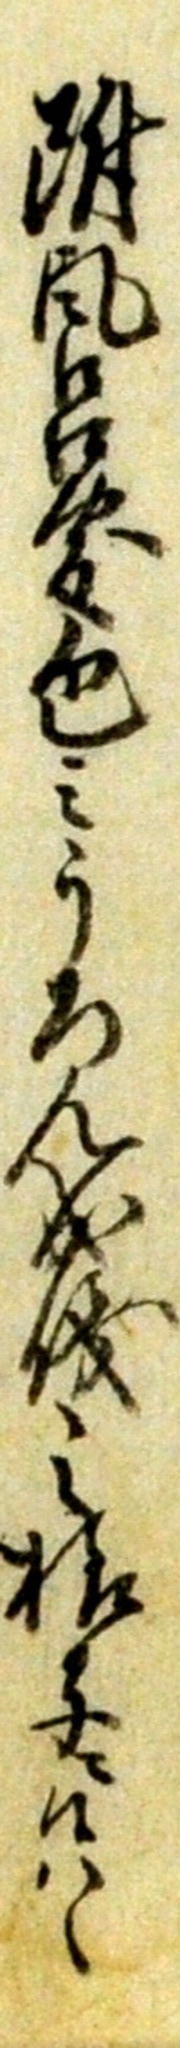附風呂敷色之うろん成儀之様子ニ候ハヽ
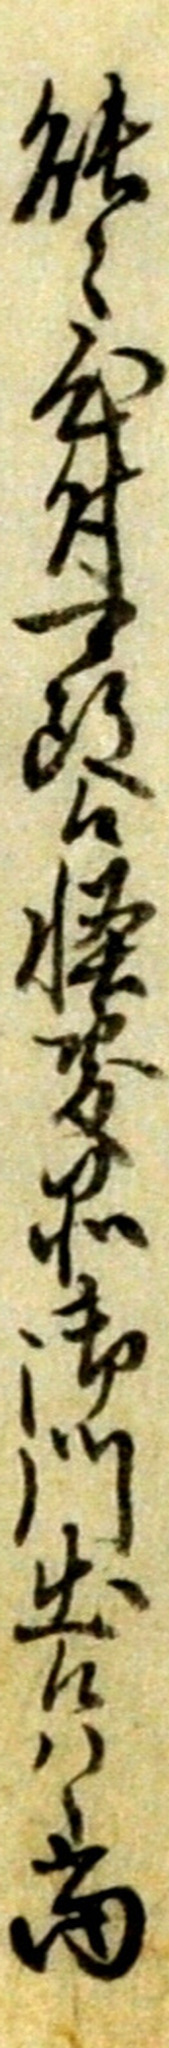能々心付可改候怪敷品御門出候ハヽ当
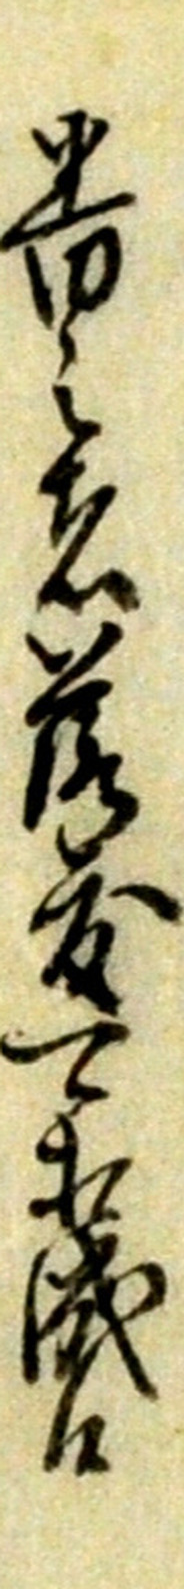番之者落度可相成候
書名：御先手組江戸御屋敷御門番勤方
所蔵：伊那市立高遠町図書館・合同会社AMANE
